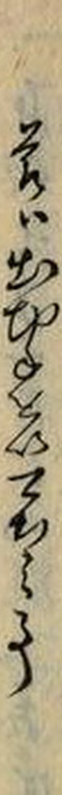節ハ出切手を以可出之事
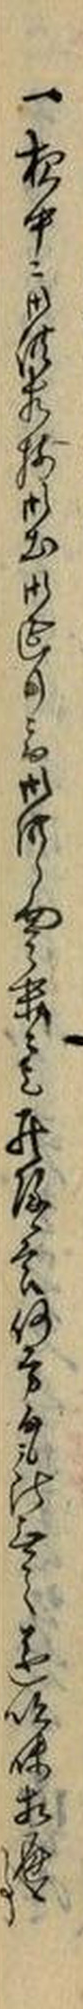一夜中ニ御供相揃御出御延用ニ而御供之面々末々迄罷帰候節何方ニ而も断無之遂吟味相通事
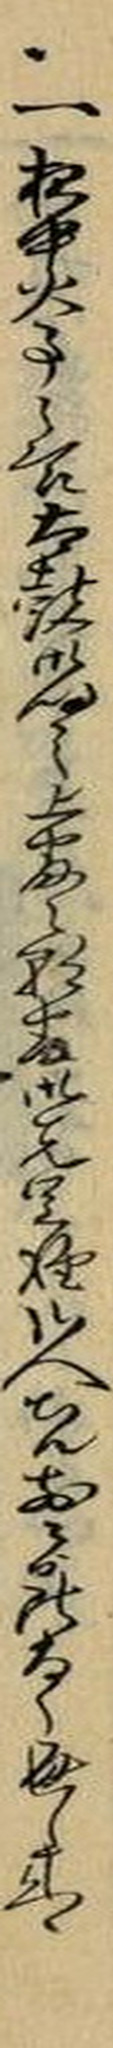一夜中火事之節太鼓御門之上番之朝番御先足軽弐人出ル前々ゟ断なく通来候
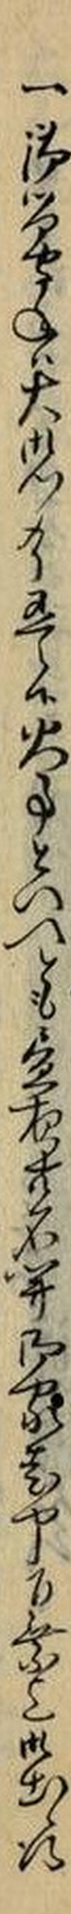一御留守年ハ大御門〆り有之候火事といへとも昼夜共不開御家老中下乗迄御出候得
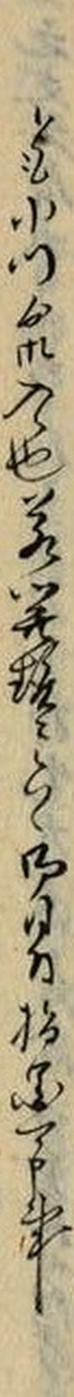とも小門ゟ御入候也若開趣ニ候ハヽ御目付指図可申事
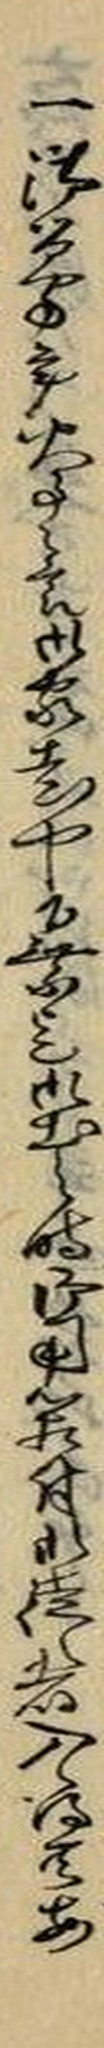一御留守年火事之節御家老中下乗迄御出之時御用箱付御徒之者入候得共前
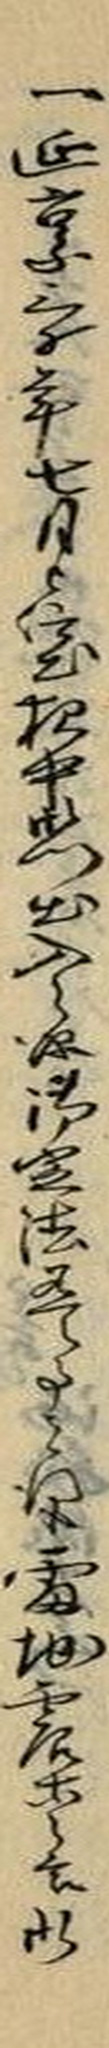一延享三寅年七月被仰出夜中御門出入之儀御定法有之事ニ候得共雷地震等之節御
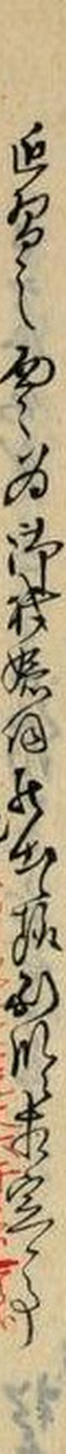近習之面々為御機嫌伺罷出候趣別段ニ相定候事
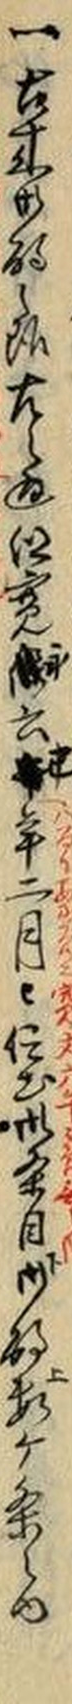一古来御触之趣左之通但寛永六己年二月被仰出御条目御触数ヶ条之内
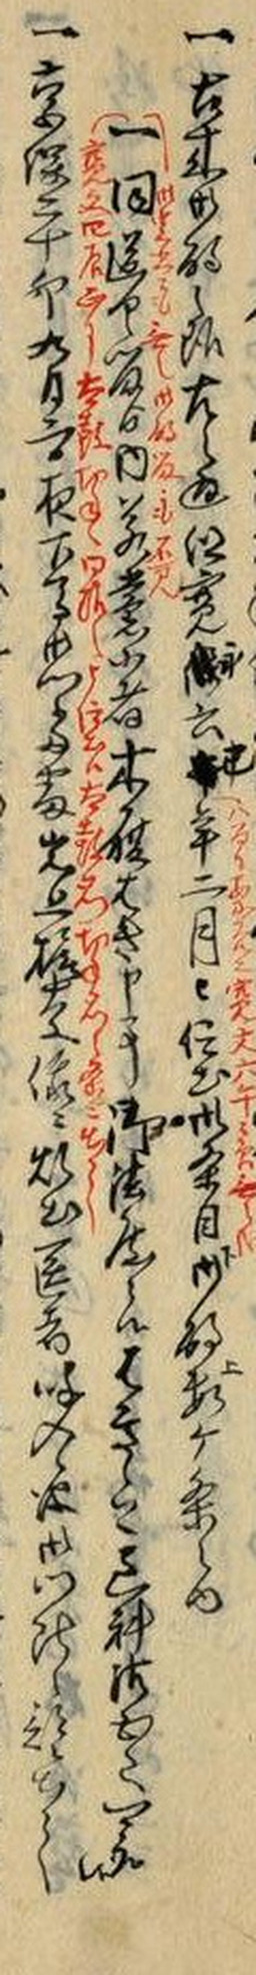一同道具留ゟ内若党小者木履はき申事御法度ニ候はき候ハヽ過料銀五匁可取候
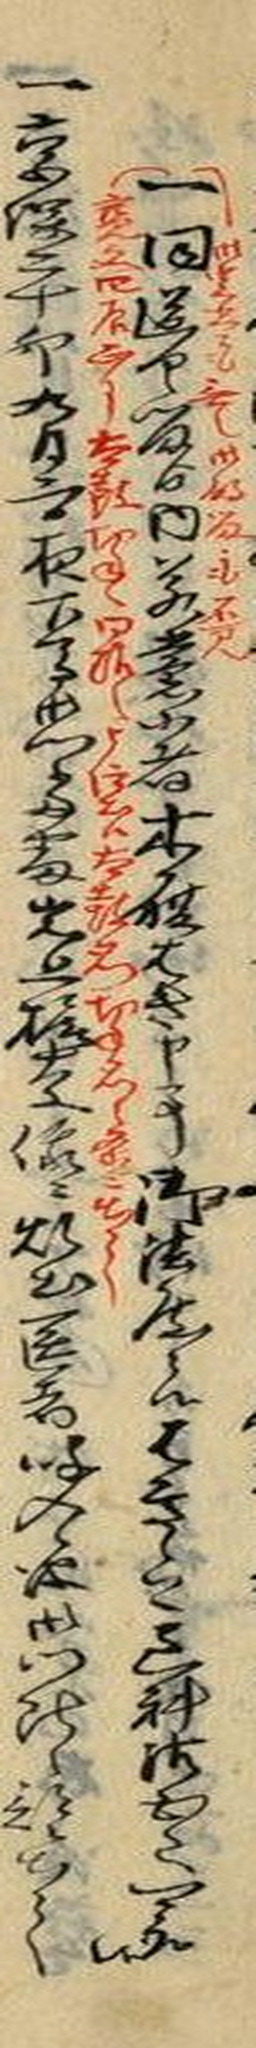一享保二十卯九月二日夜下馬御門当番岩上梶太夫俄ニ煩出医者呼入候儀御門断之部ニ出之
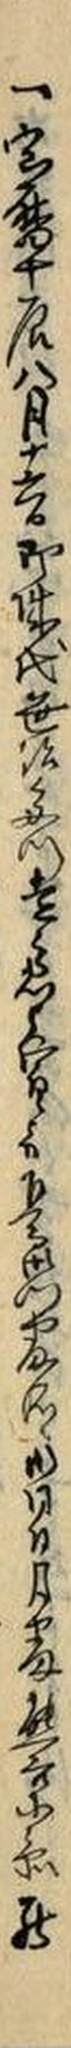一宝暦十辰八月十六日御城代笹治多門遠慮被仰付候ニ付下馬御門番所御目付月番熊谷小兵衛罷
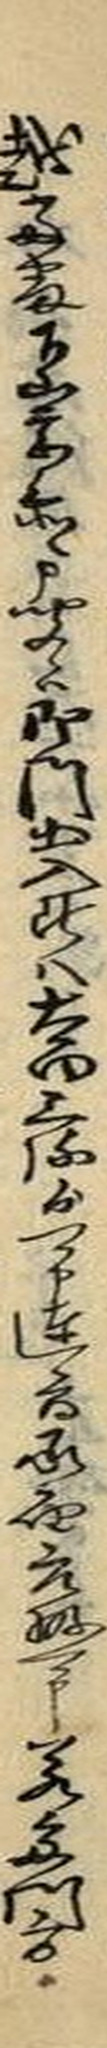越当番下山甚兵衛へ申聞候ハ御門出入断ハ太田三弥ゟ申達候間承届取扱可申若多門方
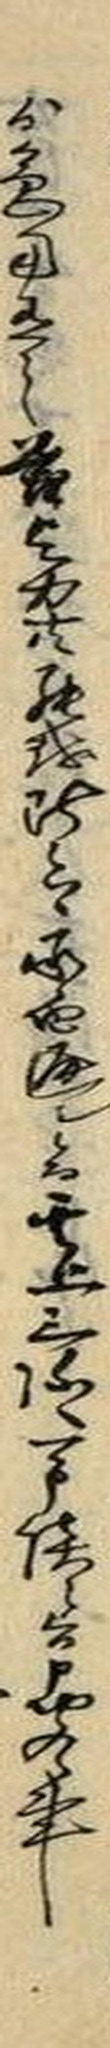ゟ急用有之暮与力共罷越断候ハゝ承届通シ候而其上三弥へ可申談之旨申聞候事
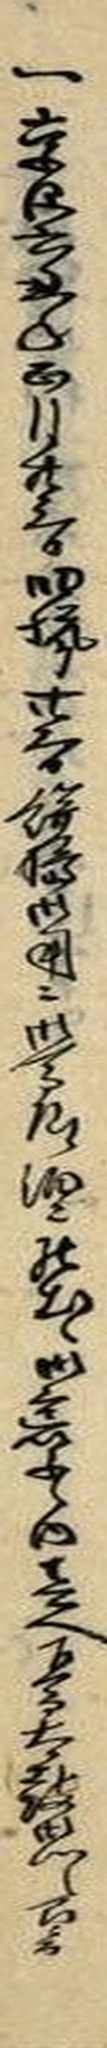一享保六丑年正月廿三日旧蝋廿二日餅搗御用ニ御馬屋へ泊ニ罷出候御荒子之内壱人下馬太鼓御門之間ニ而
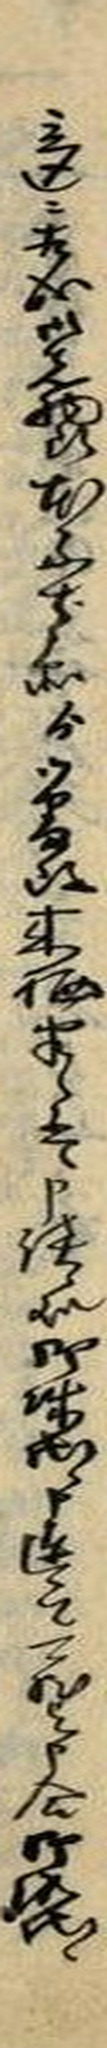立込ニ相成御先物頭本多十郎兵衛ゟ御番改来栖半之丞へ申談候処御城代へ申達候ハヽ可然与申合御城代へ
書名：御門御櫓之部
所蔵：福井県文書館 Fukui Prefectural Archives
